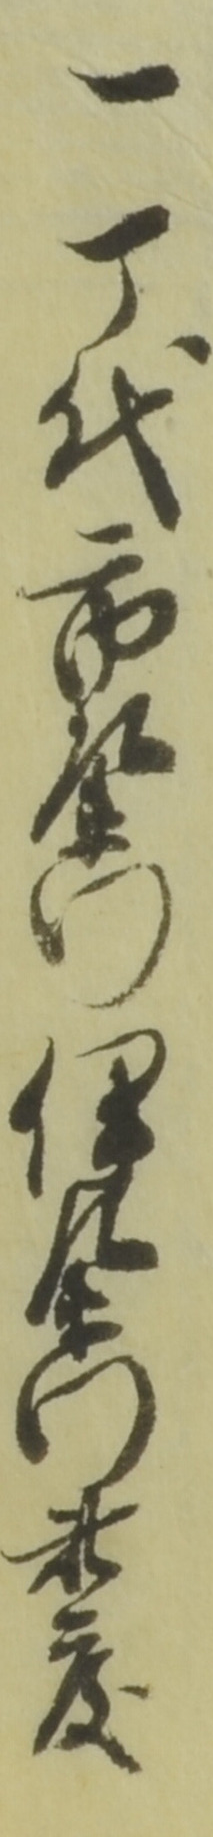一丁代市左衛門伊左衛門此度
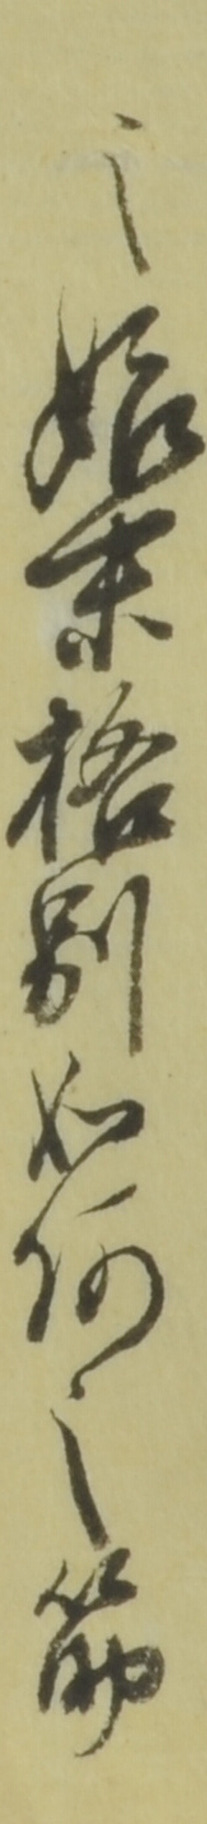之始末格別如何之筋
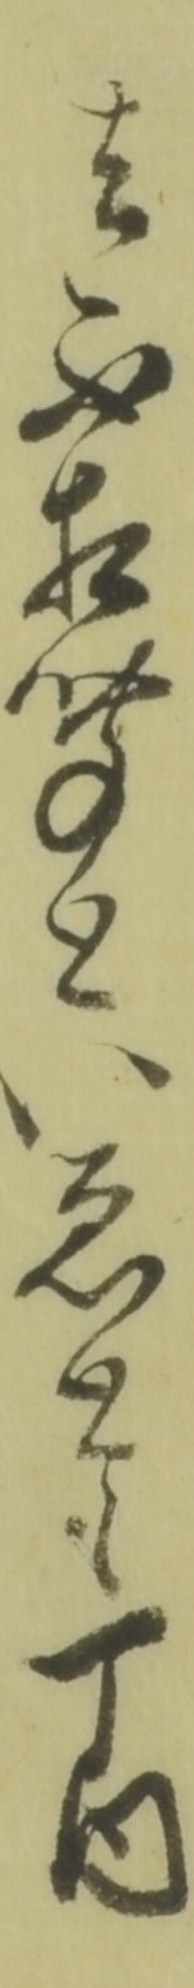は不相聞といゑとも丁内
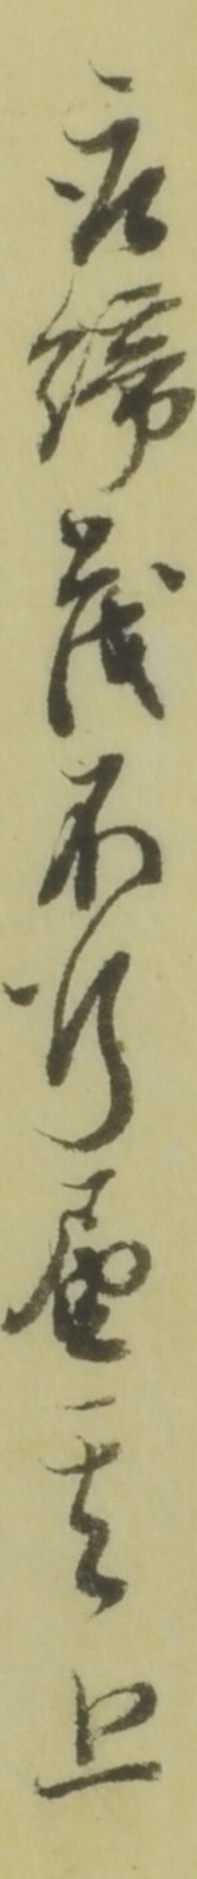取締も不行届其上
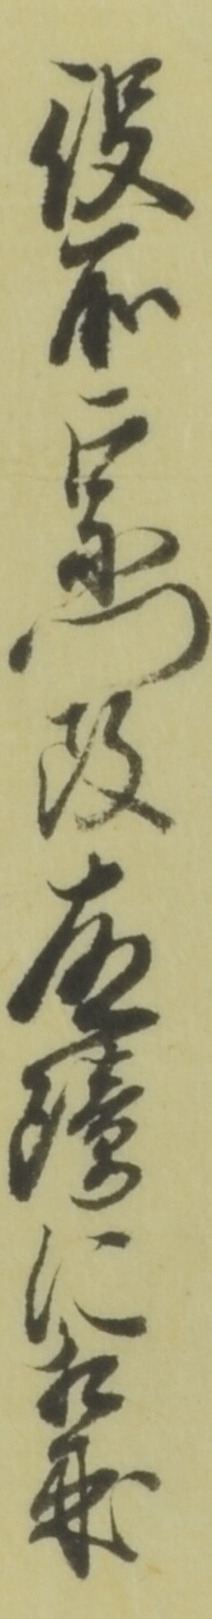役所宗門改故障に相成
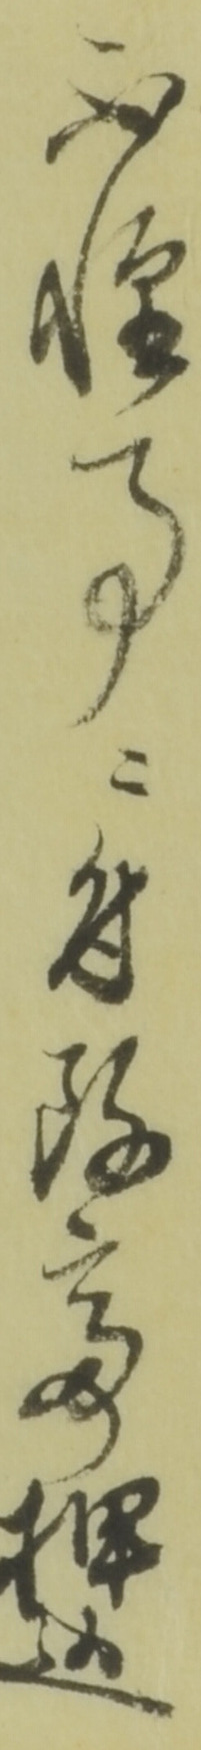不軽事ニ付存て押込
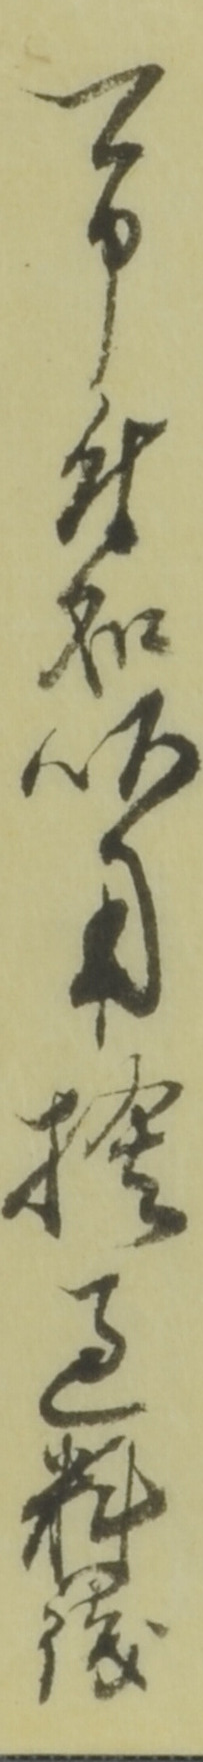可申付処以用捨過料銭
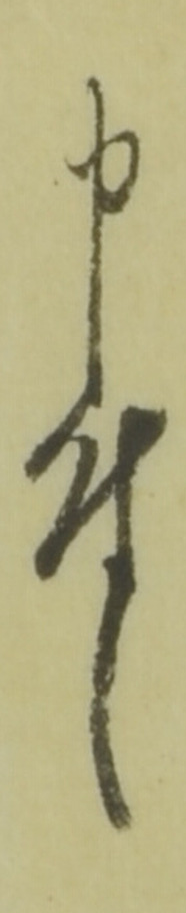申付候
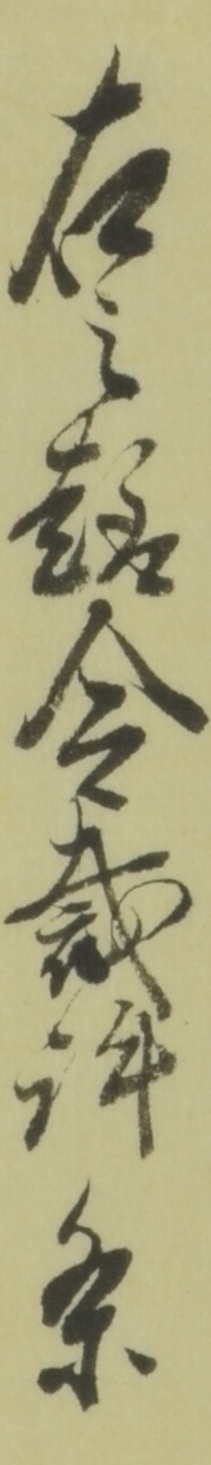右之趣令裁許条
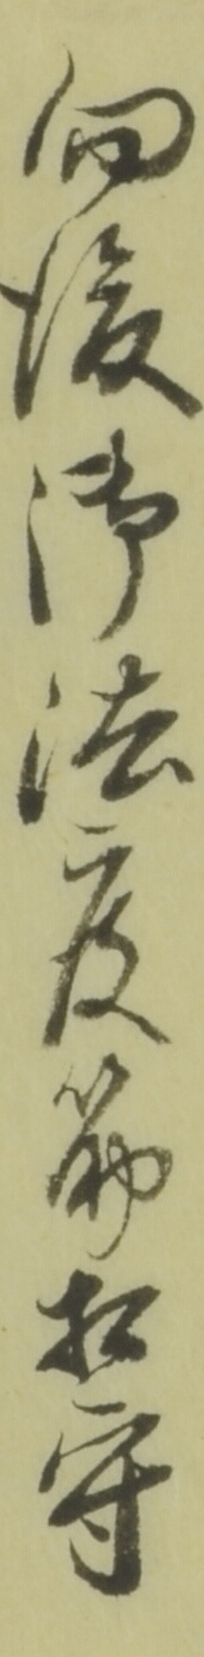向後御法度筋相守
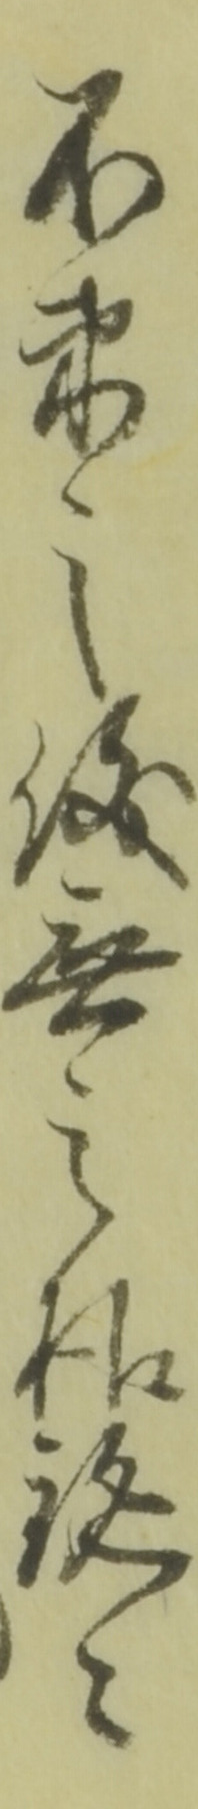不束之儀無之様銘々
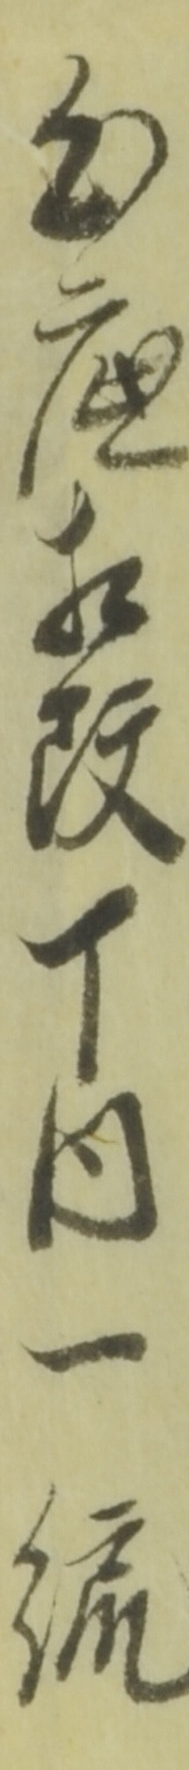心底相改丁内一統

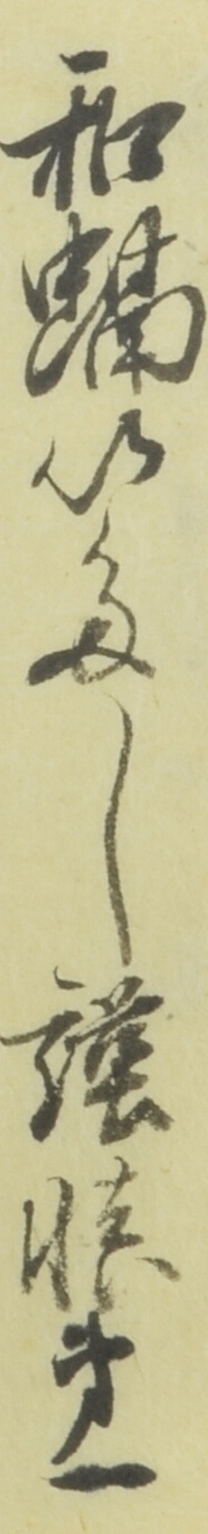和融いたし謹慎第一
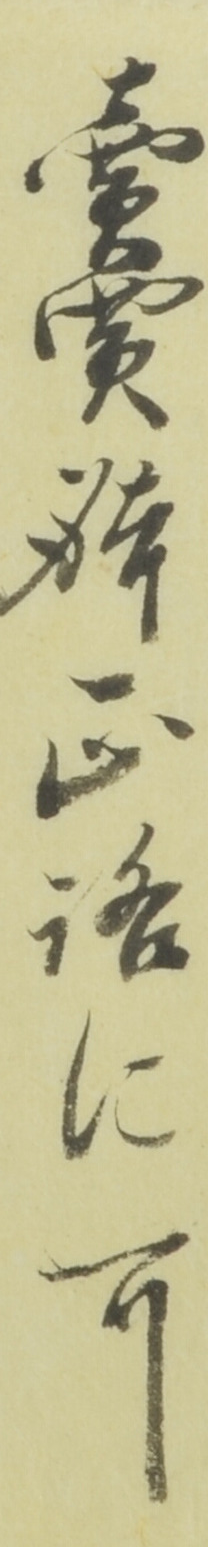売買体正路に可
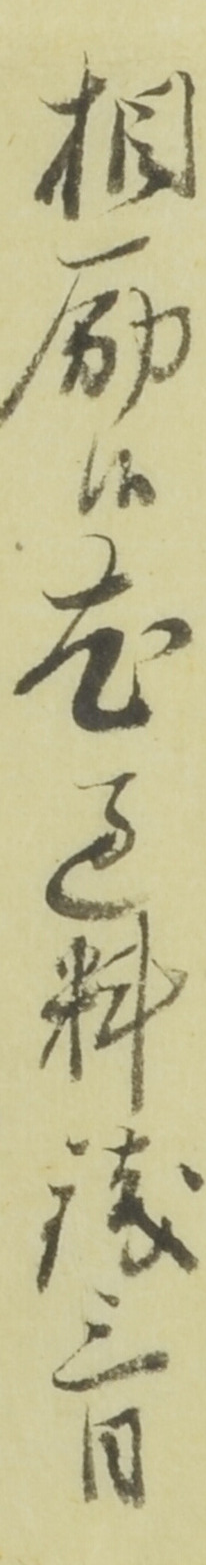相励候尤過料銭三日
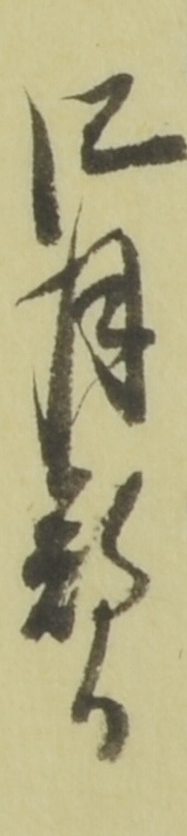四月朔日
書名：御触書御書附控
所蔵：伊那市立高遠町図書館・合同会社AMANE
